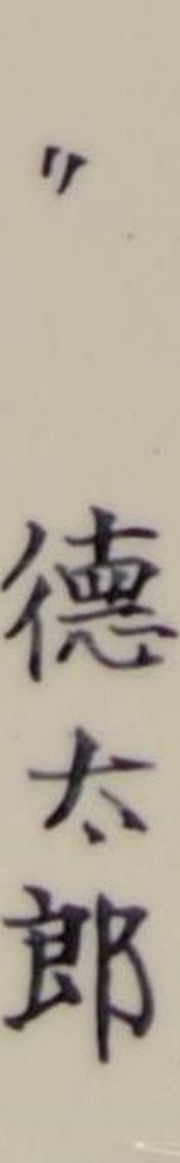徳太郎
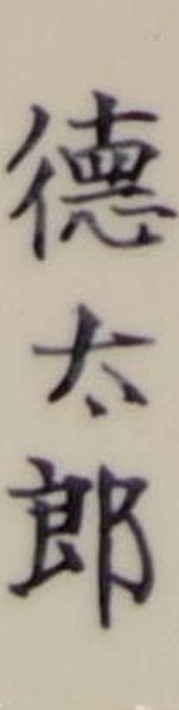徳太郎
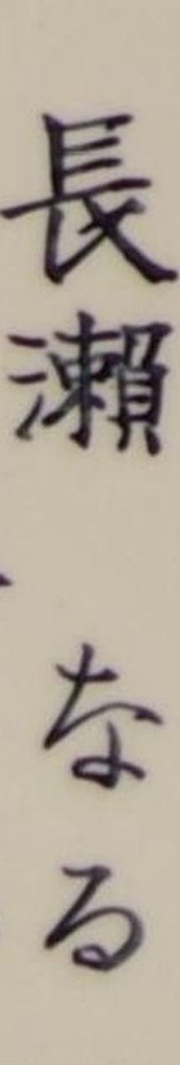長瀬なる
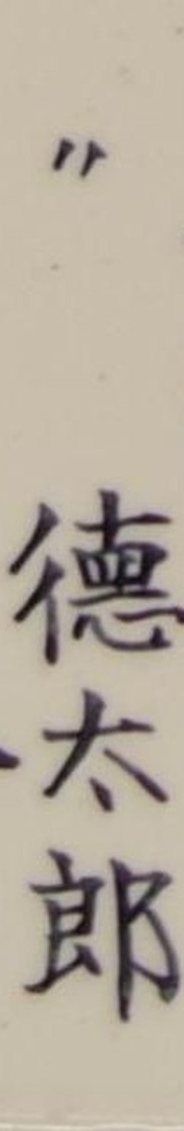徳太郎
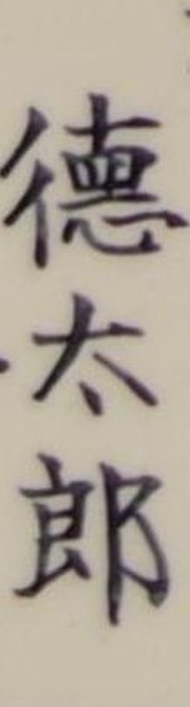徳太郎

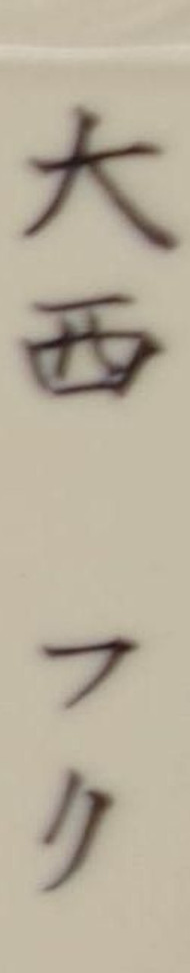大西フク
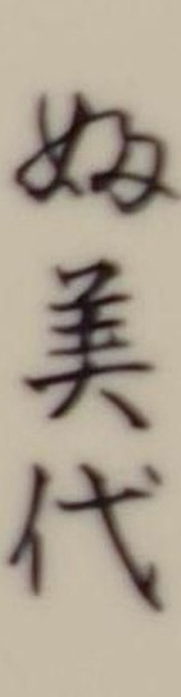ふみ代
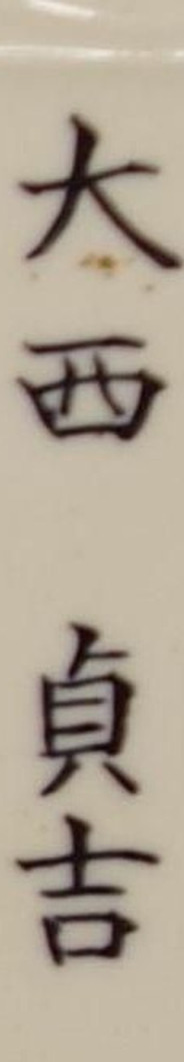大西貞吉
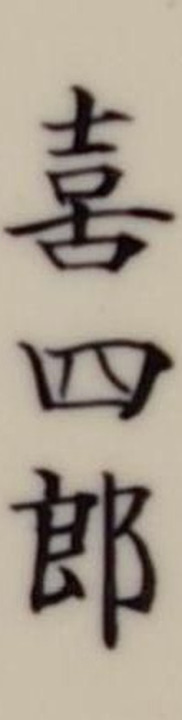喜四郎
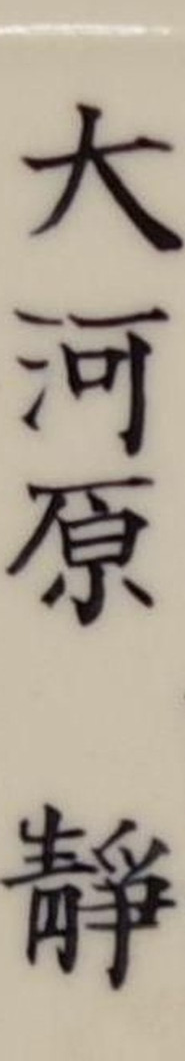大河原静
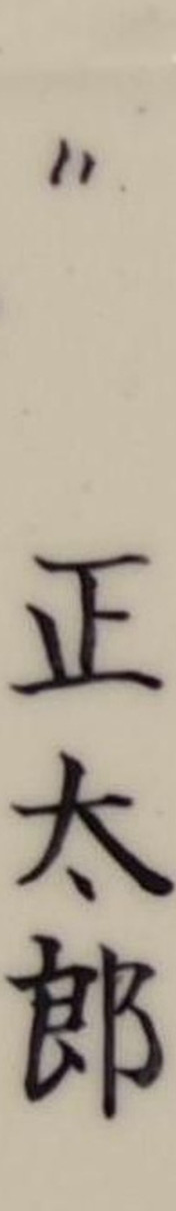正太郎
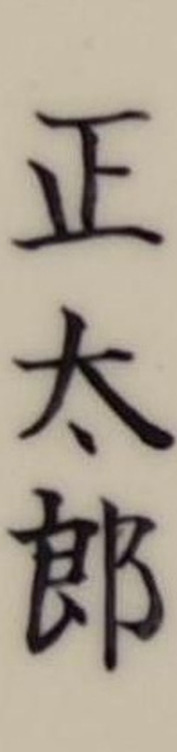正太郎
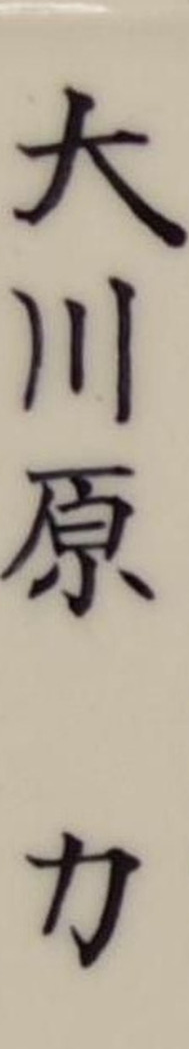大川原力
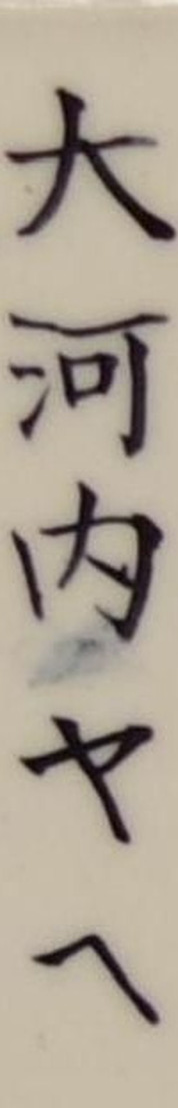大河内ヤヘ
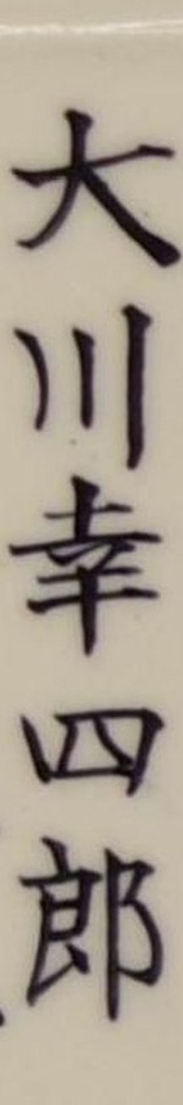大川幸四郎

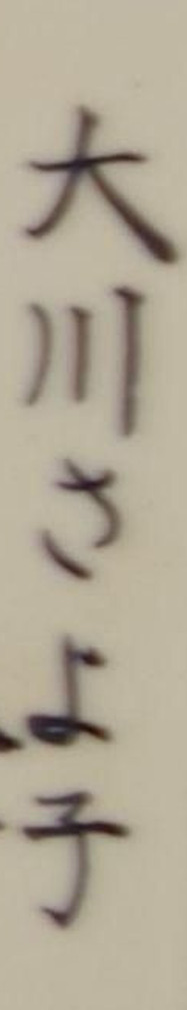大川さよ子
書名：M~S
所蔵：高野山金剛峯寺
